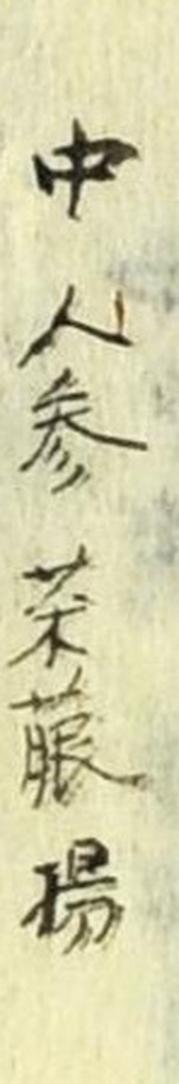中人参菜菔揚
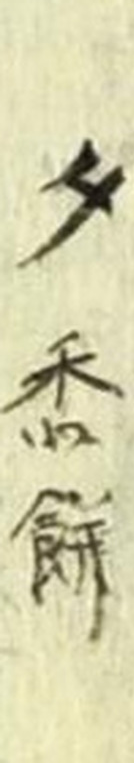中黍餅
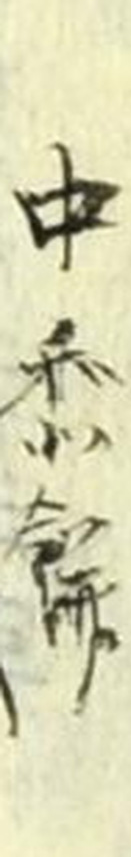中黍餅
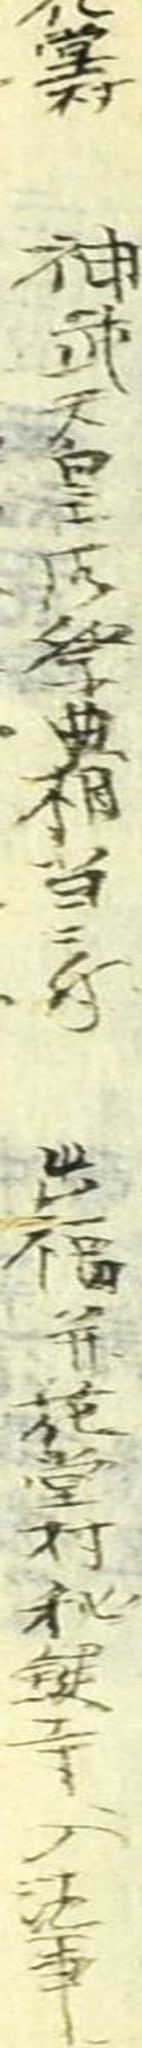神武天皇御祭典相当ニ付出福幷花堂村秘鍵寺へ入法事ニ
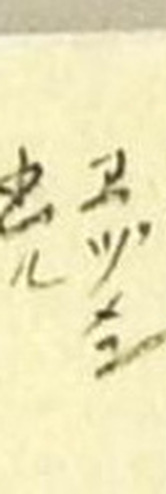ヱヅメン
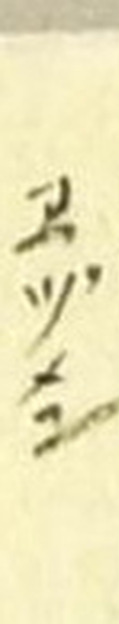ヱヅメン
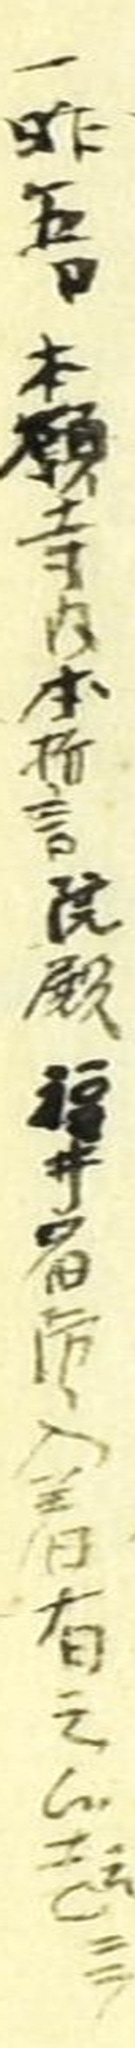一昨五日本願寺内本誓院殿福井宿防へ入着有之候趣ニテ
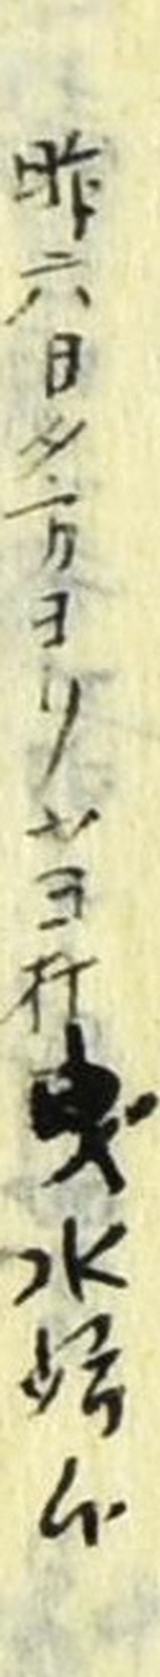昨六日夕方ヨリ当村曳水始候

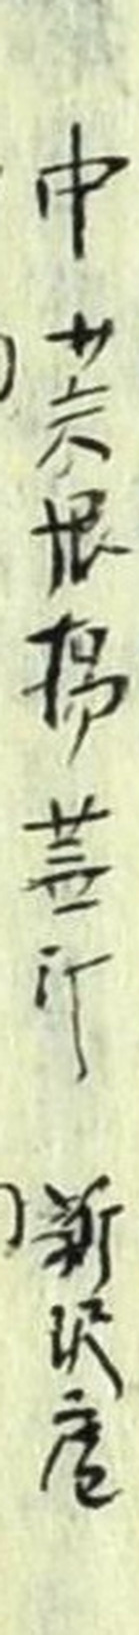中菜根揚蕪汁新沢庵
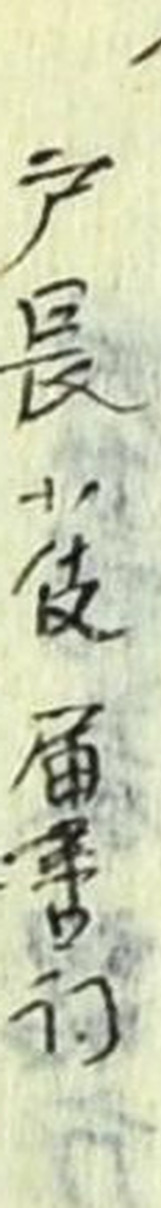戸長小伎届書調
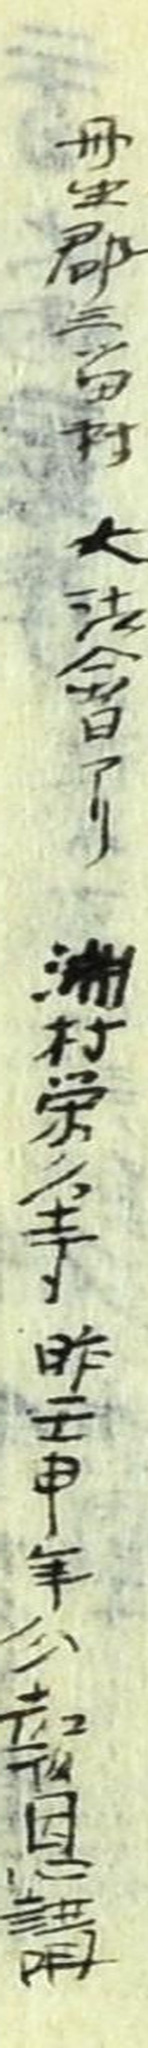丹生郡三留村大法会アリ淵村栄久寺昨壬申年分報恩講
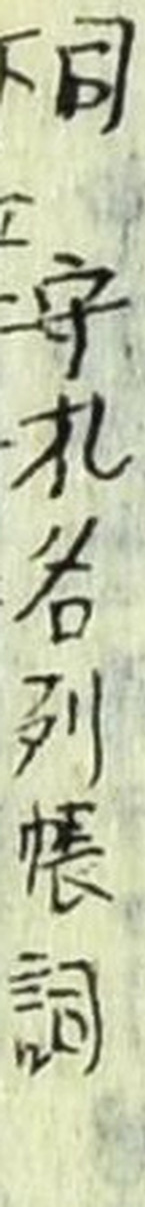同守札名列帳調
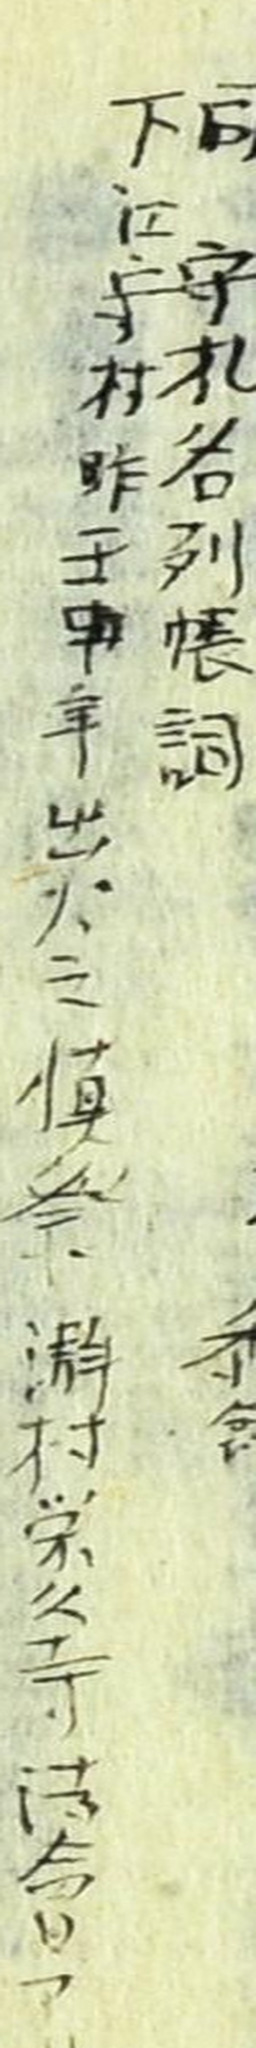下江守村昨壬申年出火之慎祭淵村栄久寺法会アリ
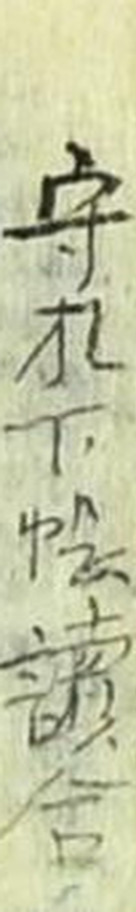守札下帳読合
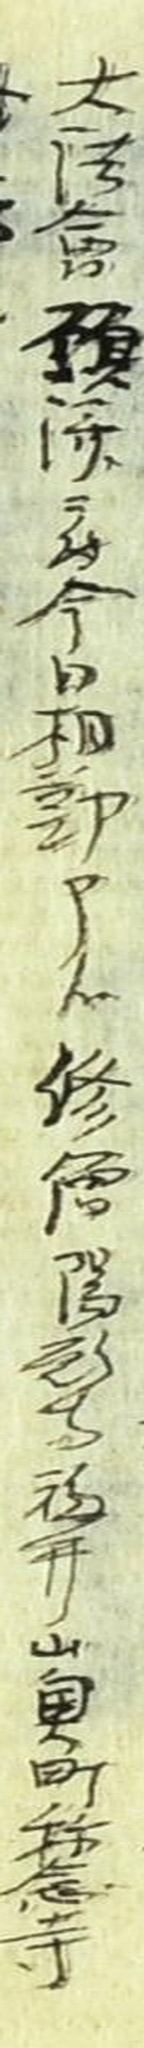大法会願済ニ付今日相勤申候修僧陽願寺福井山奥町称念寺
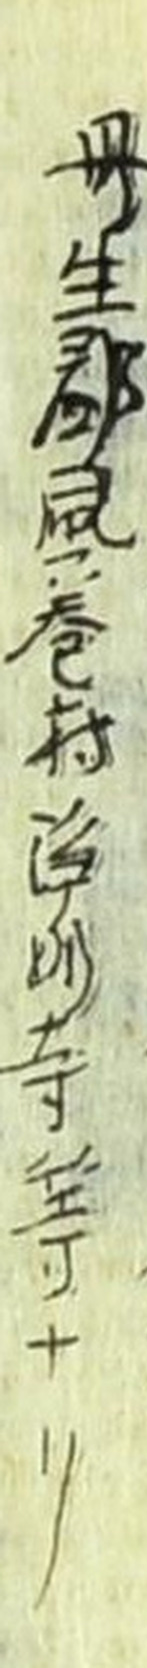丹生郡風巻村浄明寺等ナリ
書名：（日記）
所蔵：福井県文書館 Fukui Prefectural Archives
